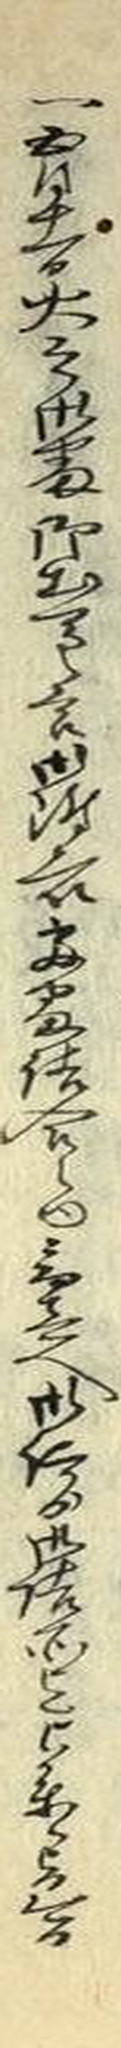一五月十一日火之御番御出馬之節御附衆当番詰合之内ニ而壱人御跡ゟ御詰所迄被参候旨今日
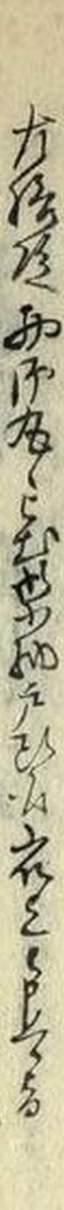左膳殿西御丸へ被出御小納戸頭取衆迄被申上候旨
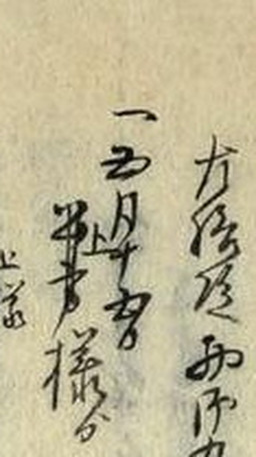一五月十五日
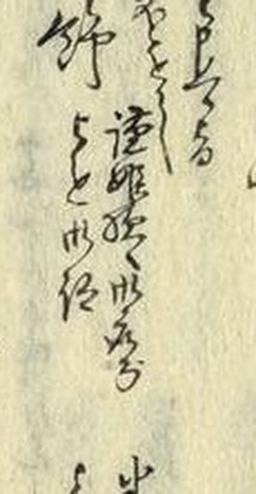謹姫様へ御取分
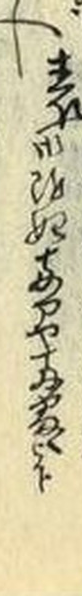御附両部屋両番へ被下
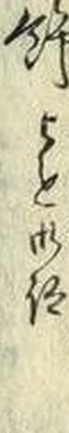被進御跡
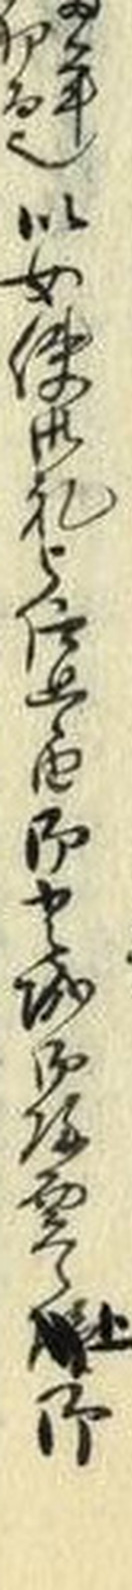御初而也以女使御礼被仰上候由御登城御帰殿之上御
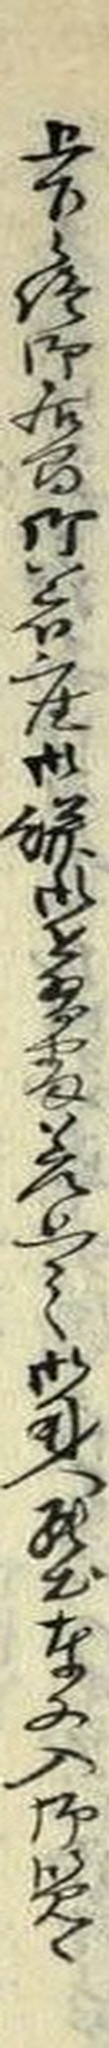上下之儘御居間御着座御餅御近習番差上之御用人罷出奉文入御覧候
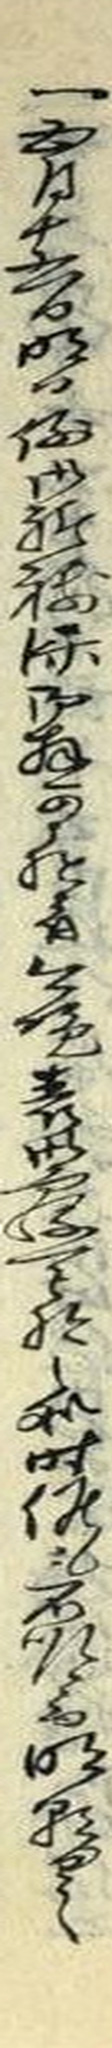明日例御祈禱済御拝可被遊ニ付今晩表御寝可被遊候処時候も不順ニ而明朝ゟ之
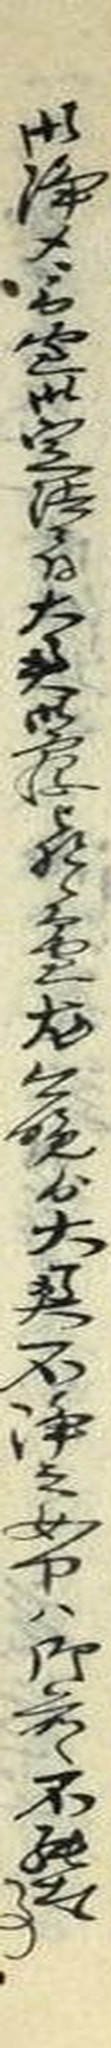御浄メニ而宜御定法ニ付大奥御寝被遊候而宜尤今晩ゟ大奥不浄之女中ハ御前へ不罷出候事
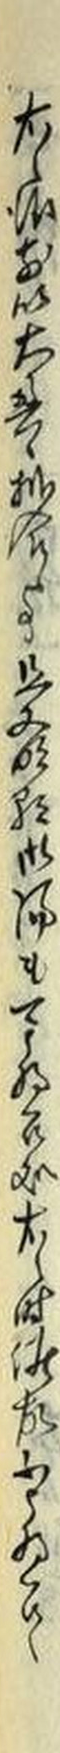右之趣前以大奥へ掛合候事且又明朝御湯も可被為召処右之時候故不被為召候
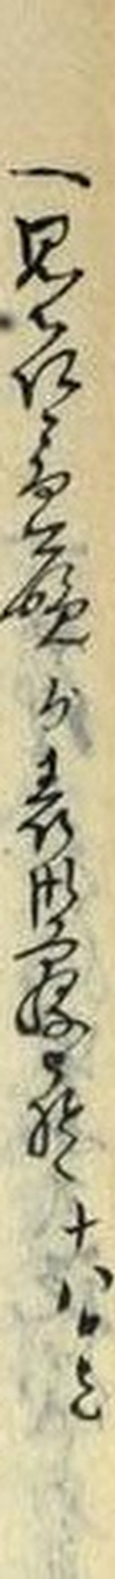一思召ニ而今晩ゟ表御寝被遊候十八日迄
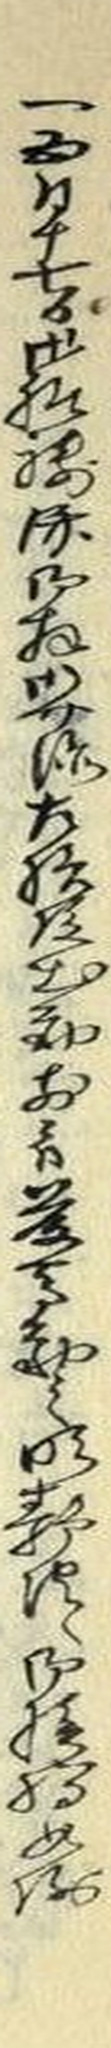御祈禱済御拝御介添左膳殿出勤前ニ付藤馬勤之明静院へ御挨拶如例
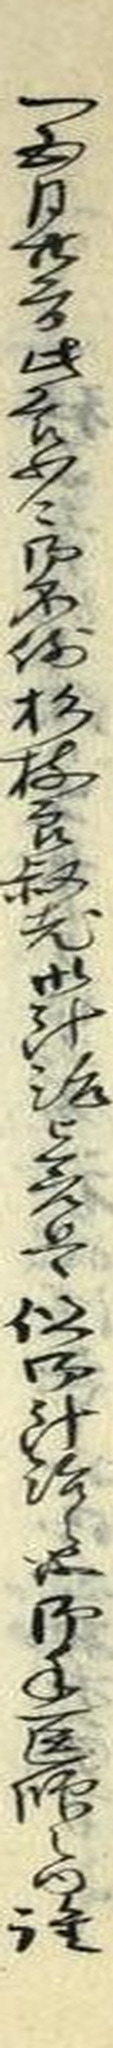此節少々御不例杉枝良叔老御針治被差上候但御針治之儀御手医師之内誰
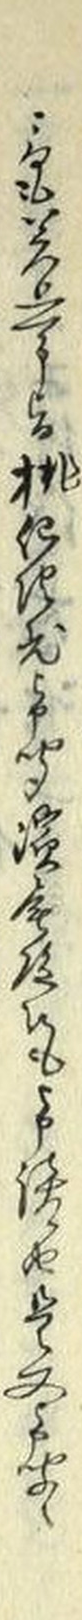ニ而も差上可申旨桃仙院老被申聞浜尾殿江も被申談候由是又被申聞候
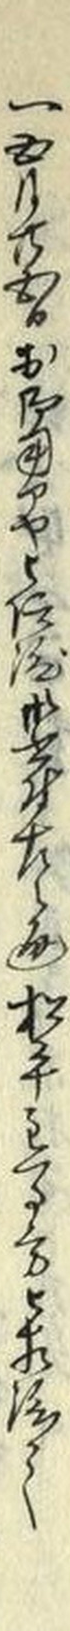一五月廿五日於御用部屋被仰渡御書付左之通松平主馬方被相渡之
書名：少傅日録抄（斉善付側向頭取日記、在府）
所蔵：福井県文書館 Fukui Prefectural Archives
